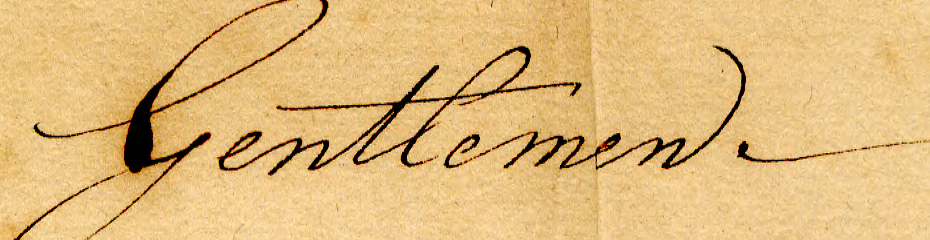Gentlemen-
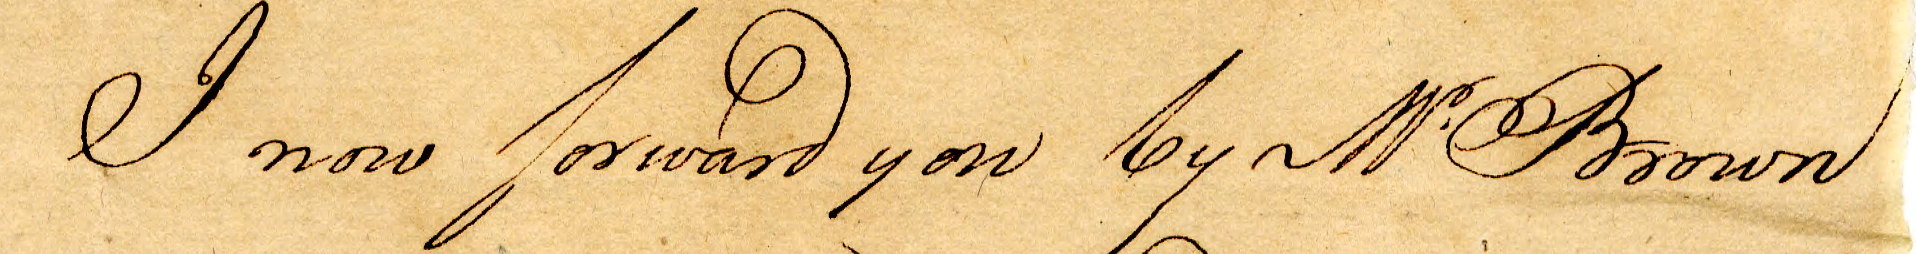I now forward you by M^r. Brown
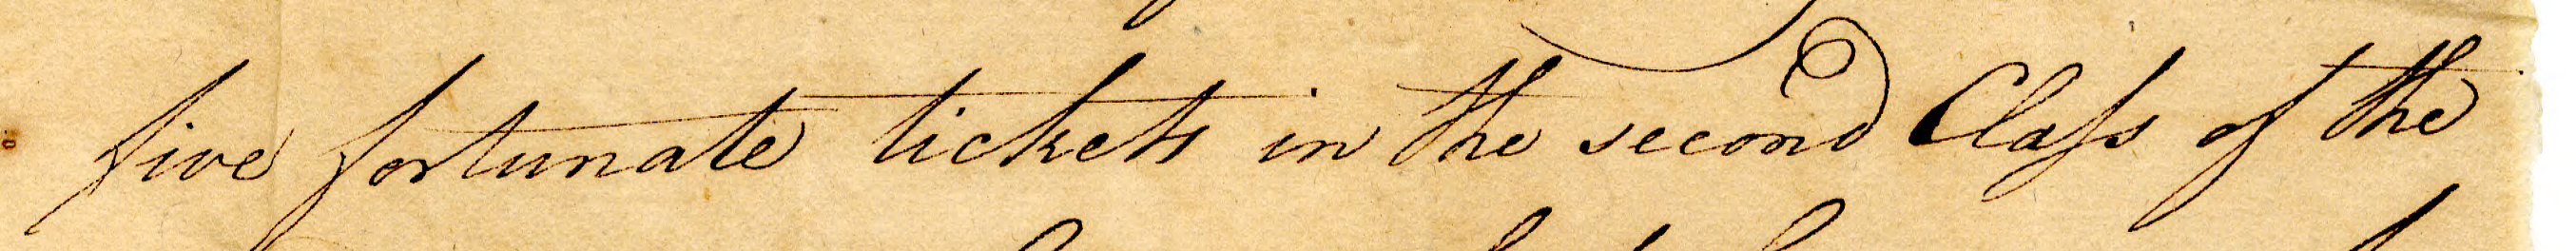five fortunate tickets in the second Class of the
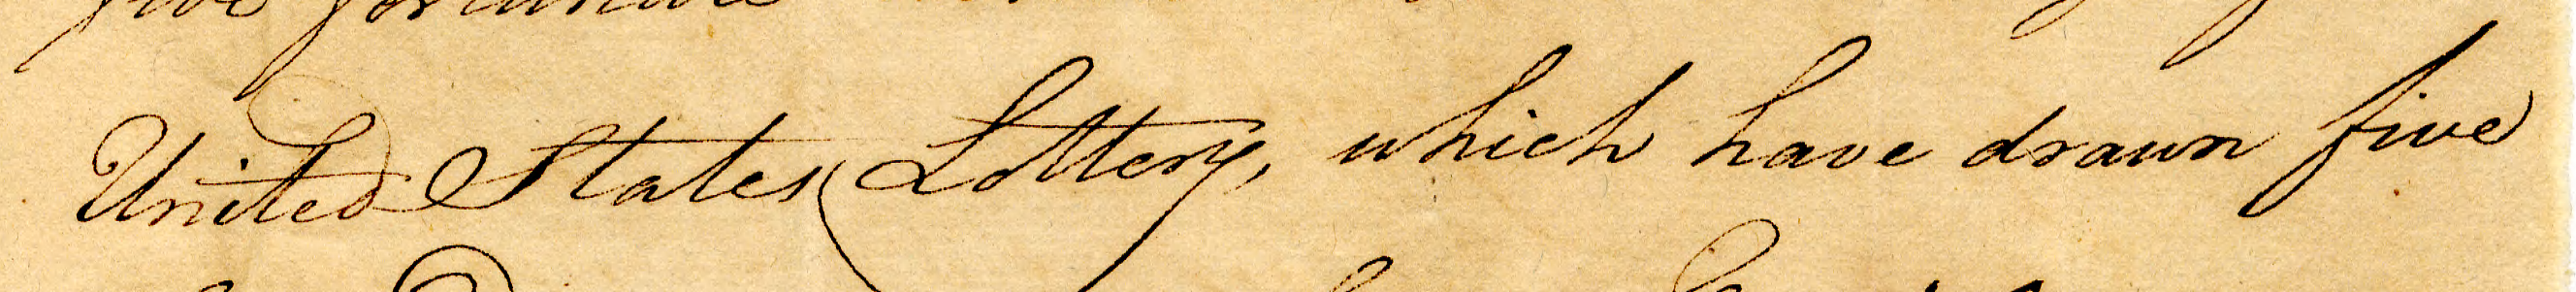United States Lottery, which have drawn five
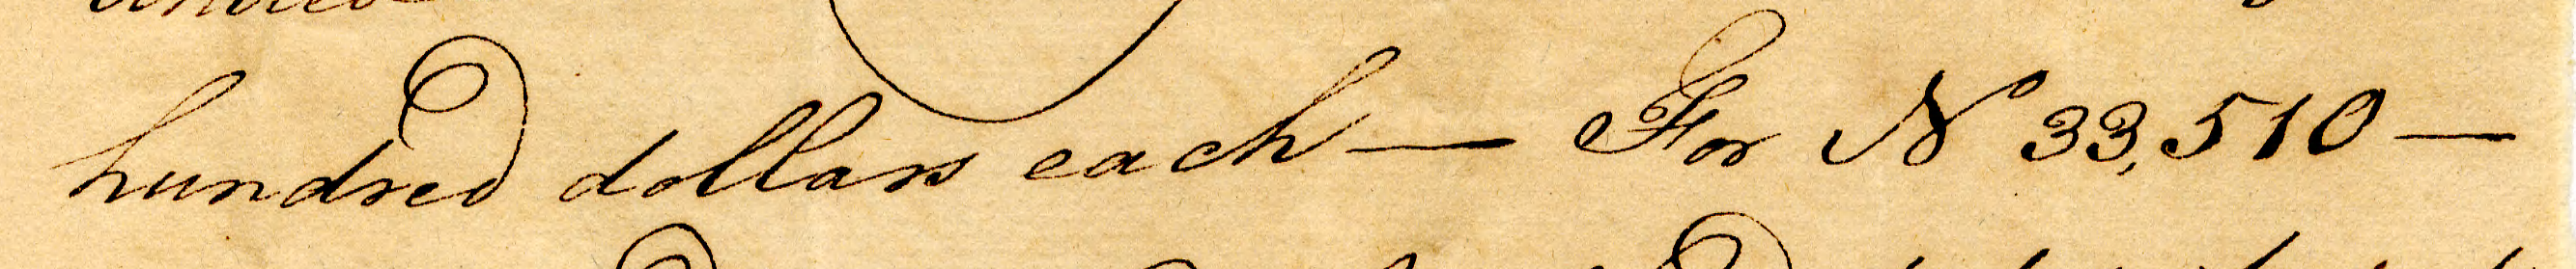hundred dollars each- For N^o 33,510-
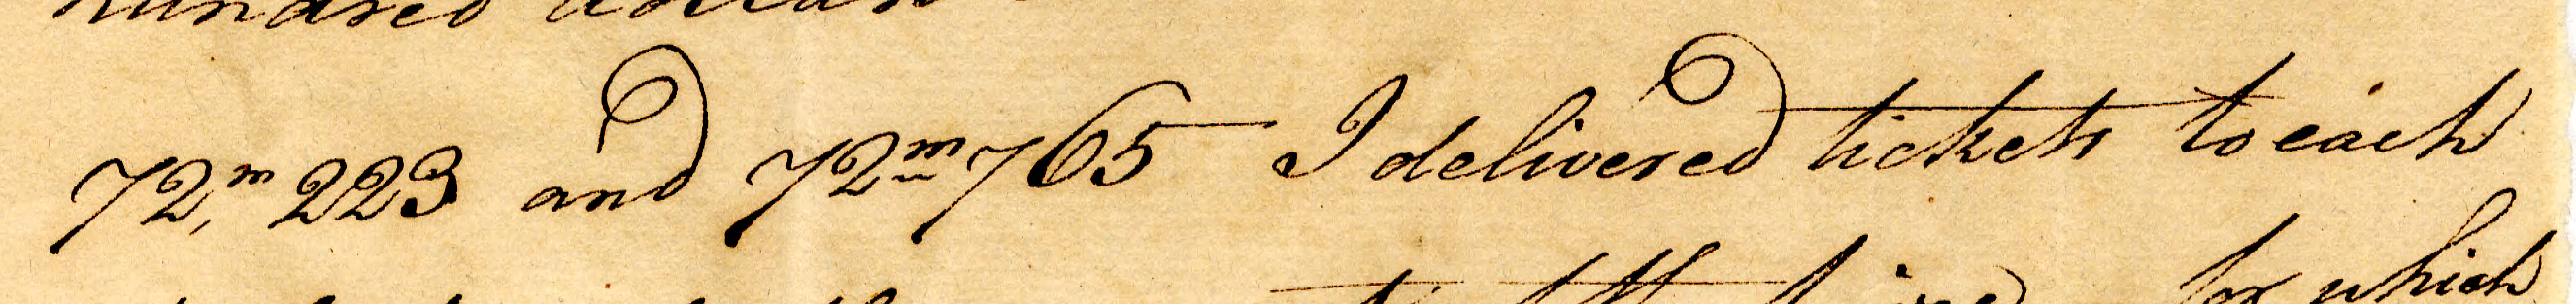72,^m223 and 72^m765 I delivered tickets to each
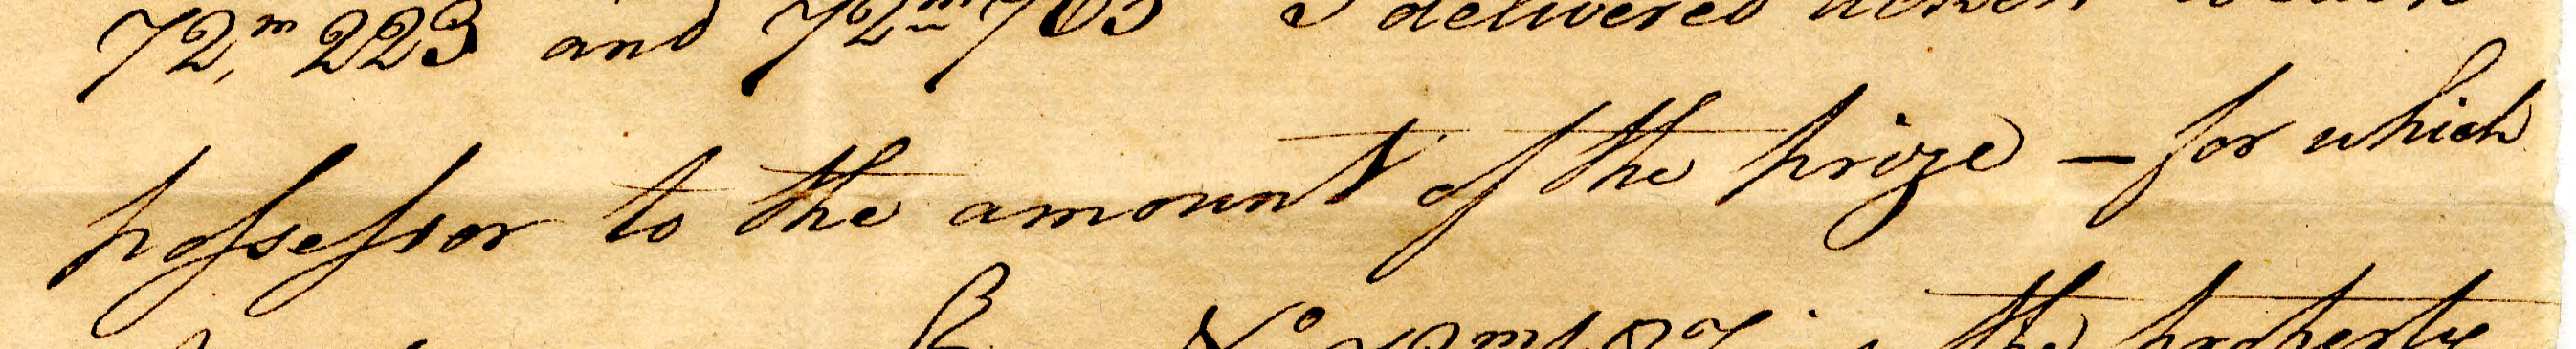possessor to the amount of the prize- for which
